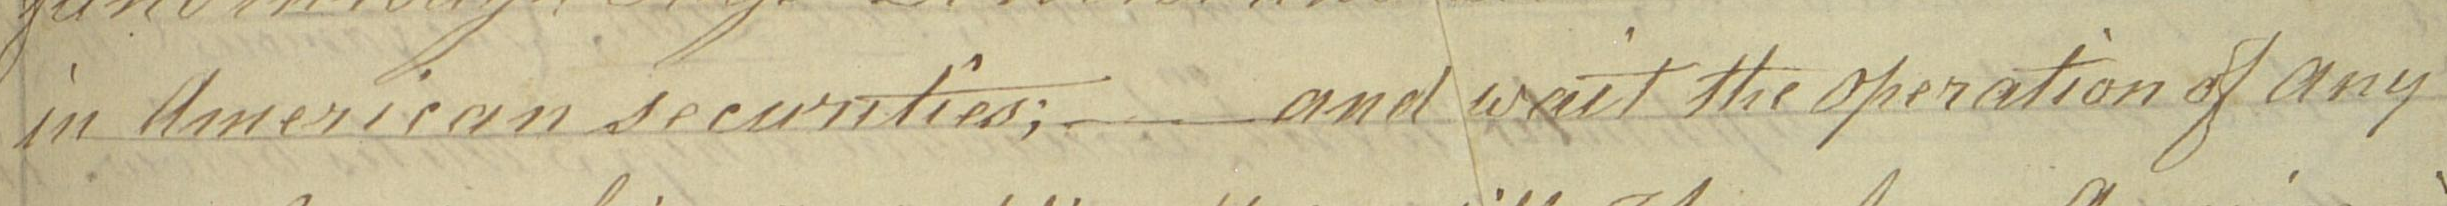in American securities; and wait the operation of any
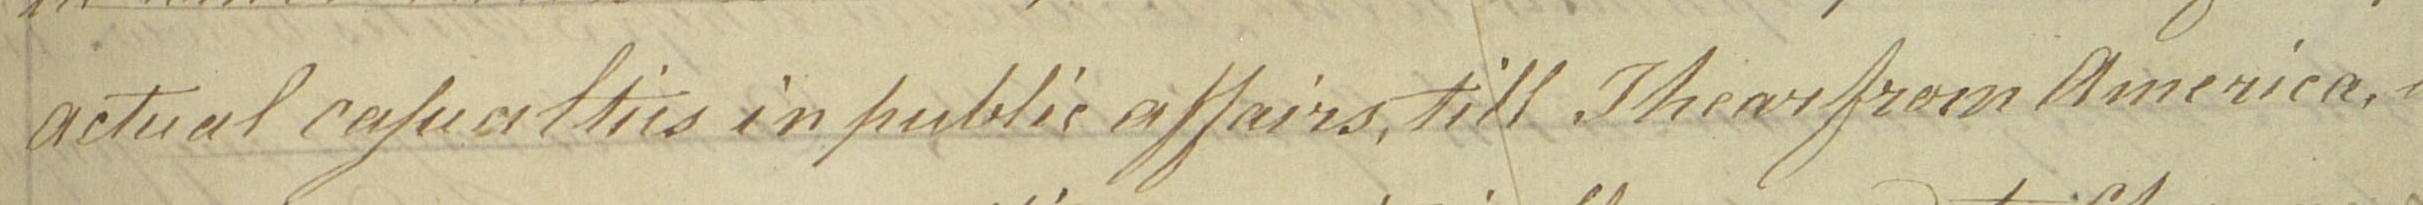actual casualties in public affairs, till I hear from America, in
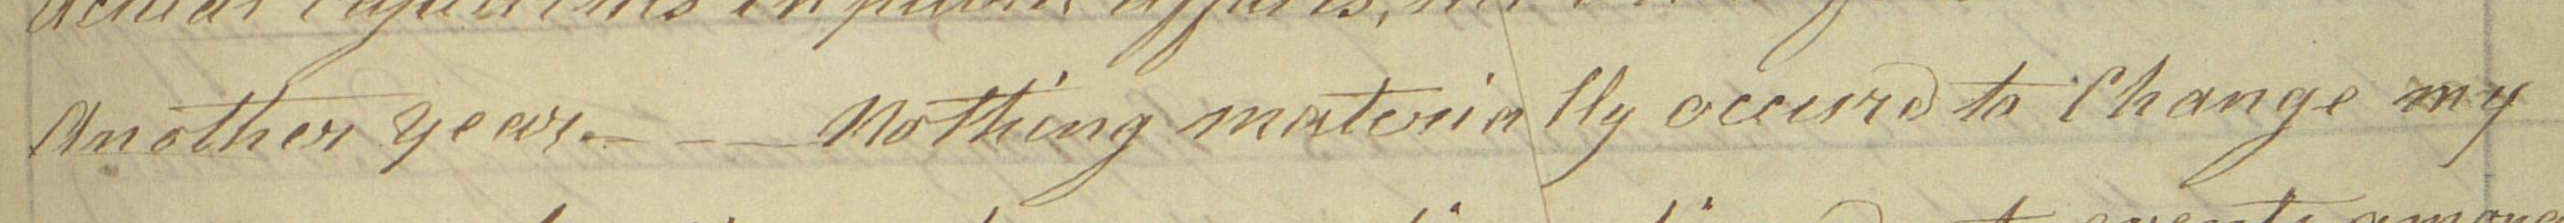another year. Nothing materially occurd to Change my
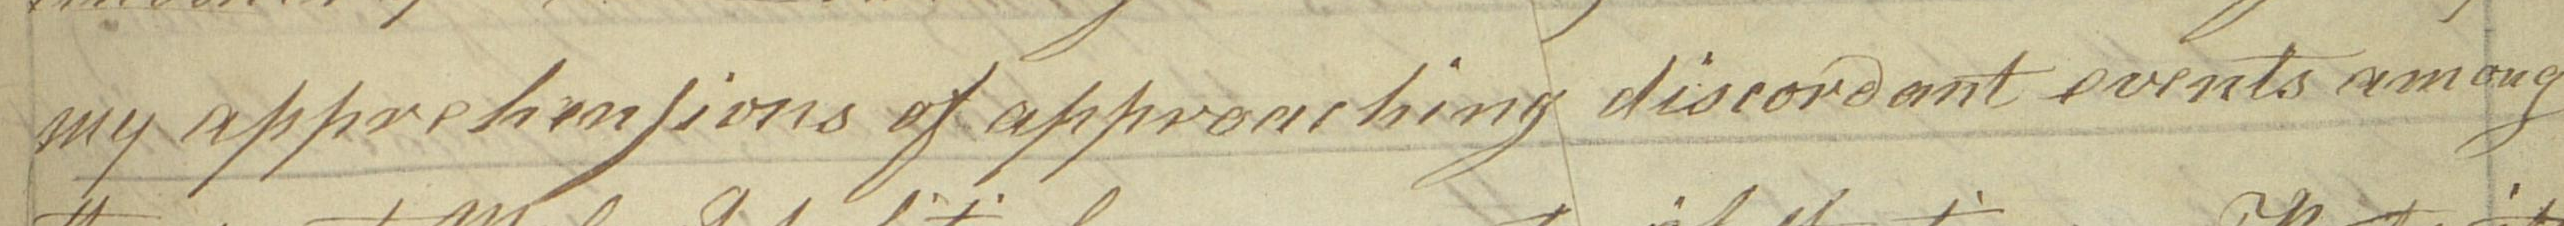my apprehensions of approaching discordant events among
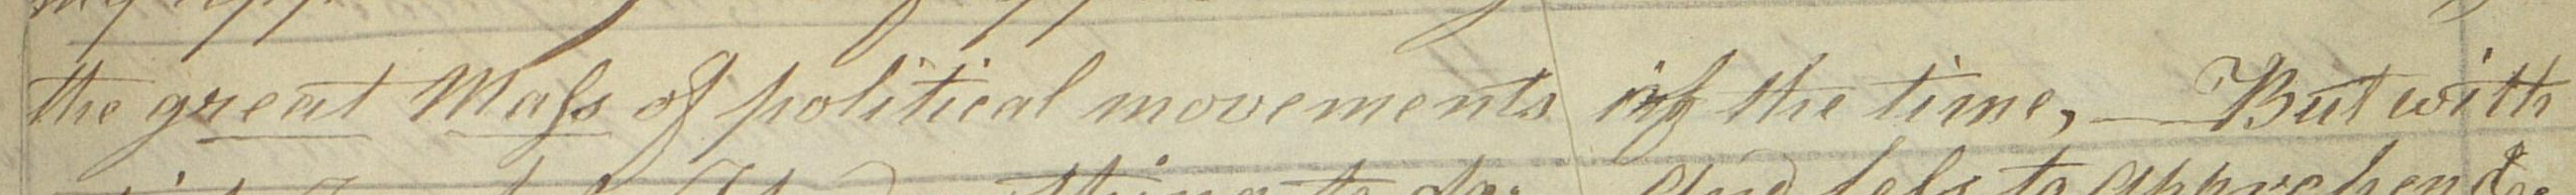the great Mass of political movements of the time, But with
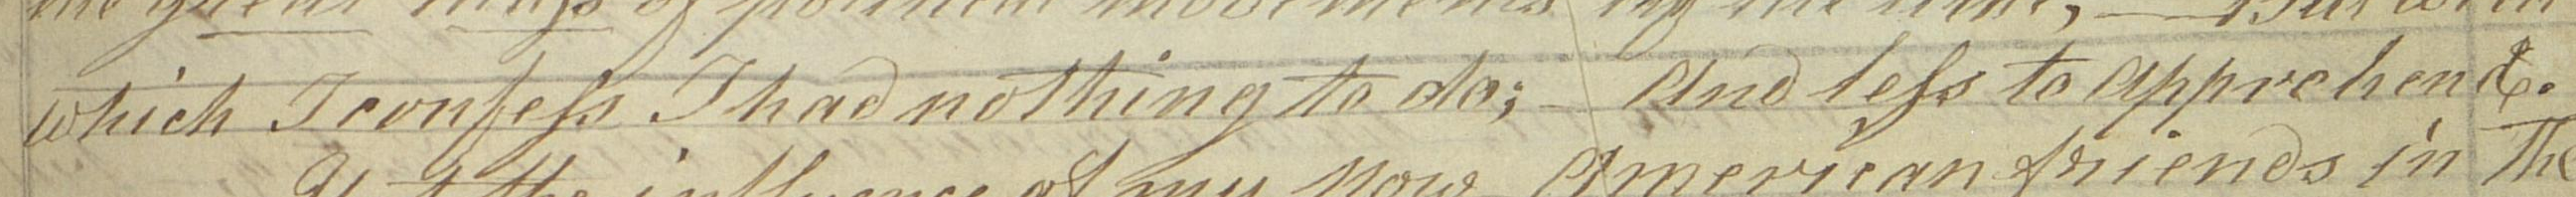which I confess I had nothing to do; And less to apprehend
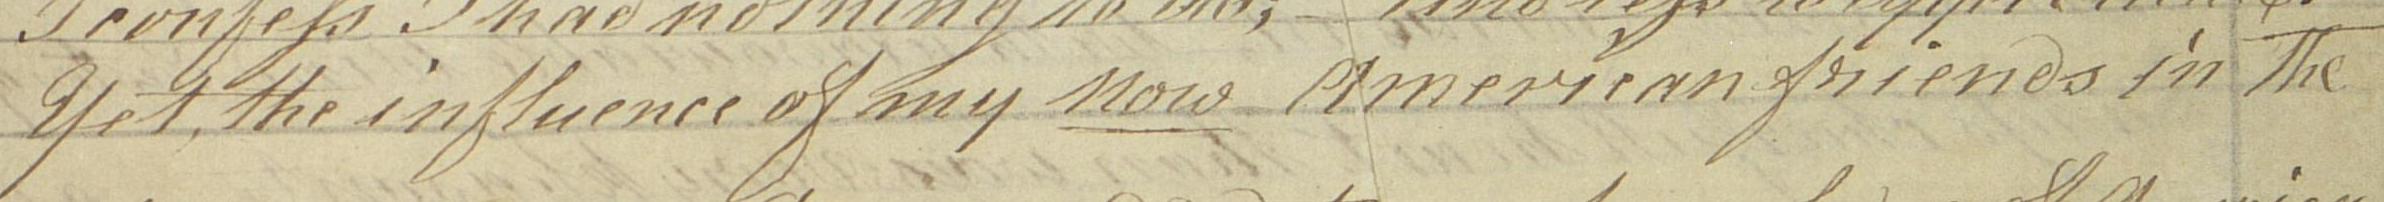Yet the influence of my now American friends in the
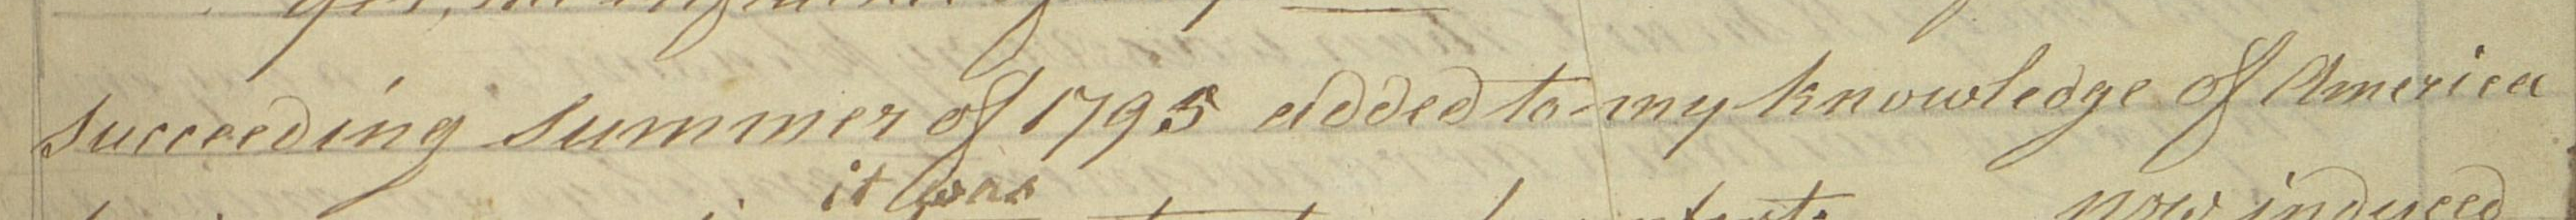succeeding summer of 1795 added to my knowledge of America
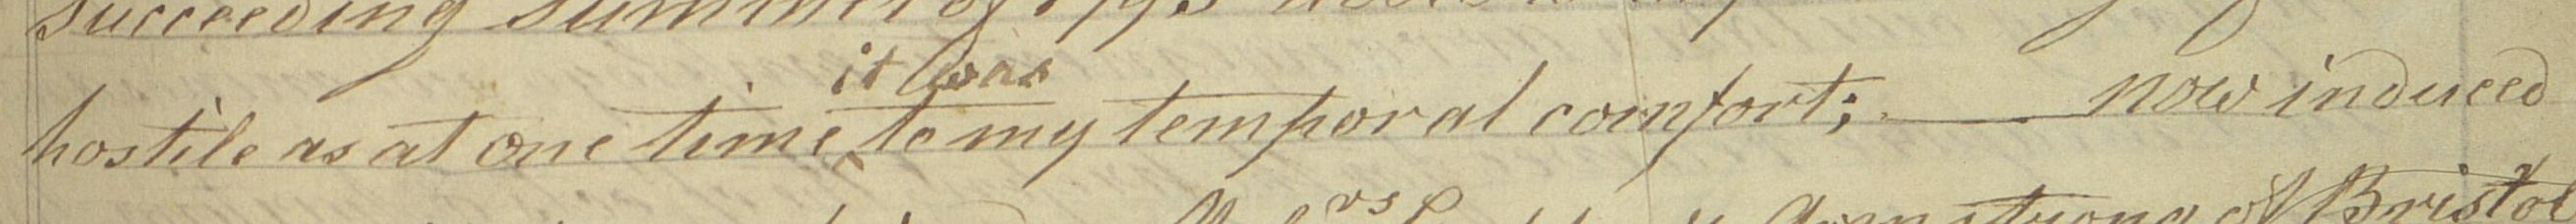hostile as at one time ^ to my temporal comfort; Now induced
